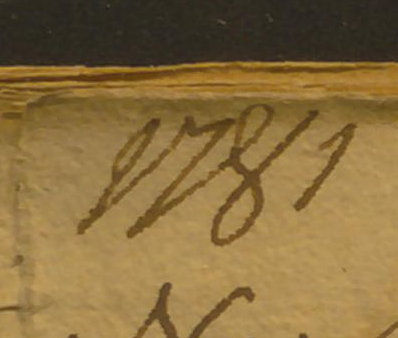1781
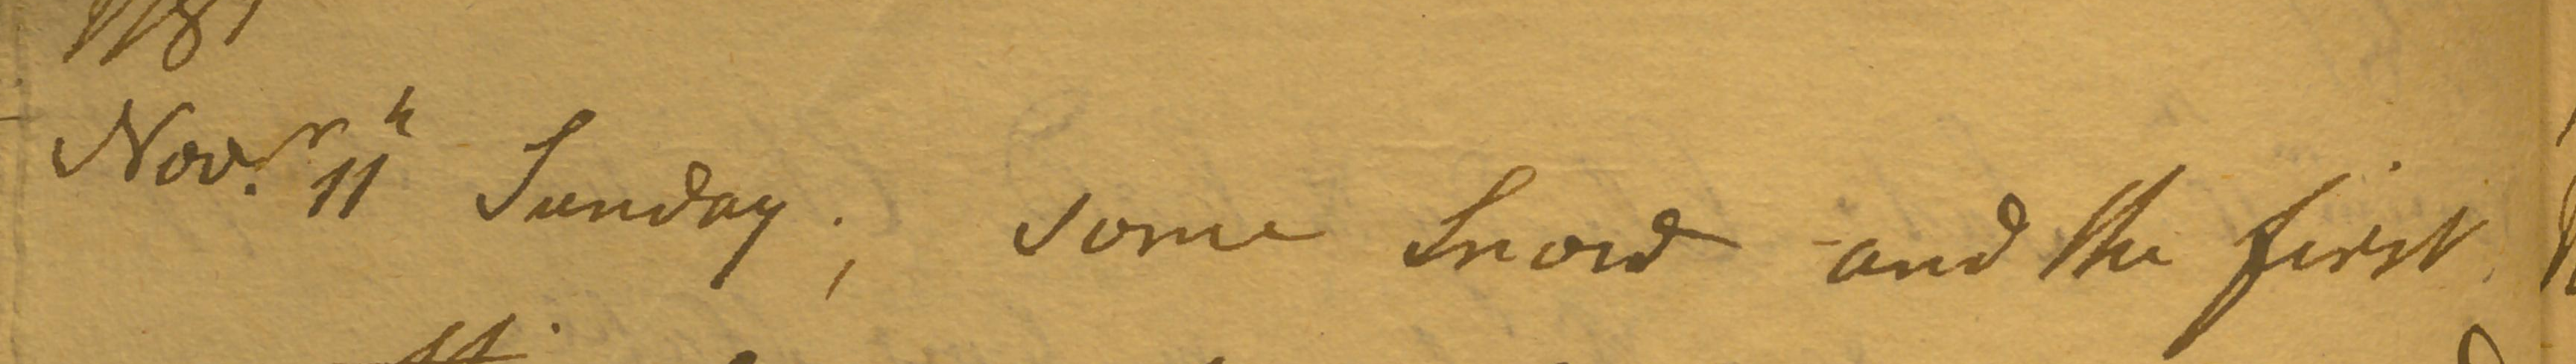Nov^r. 11 Sunday. some snow and the first
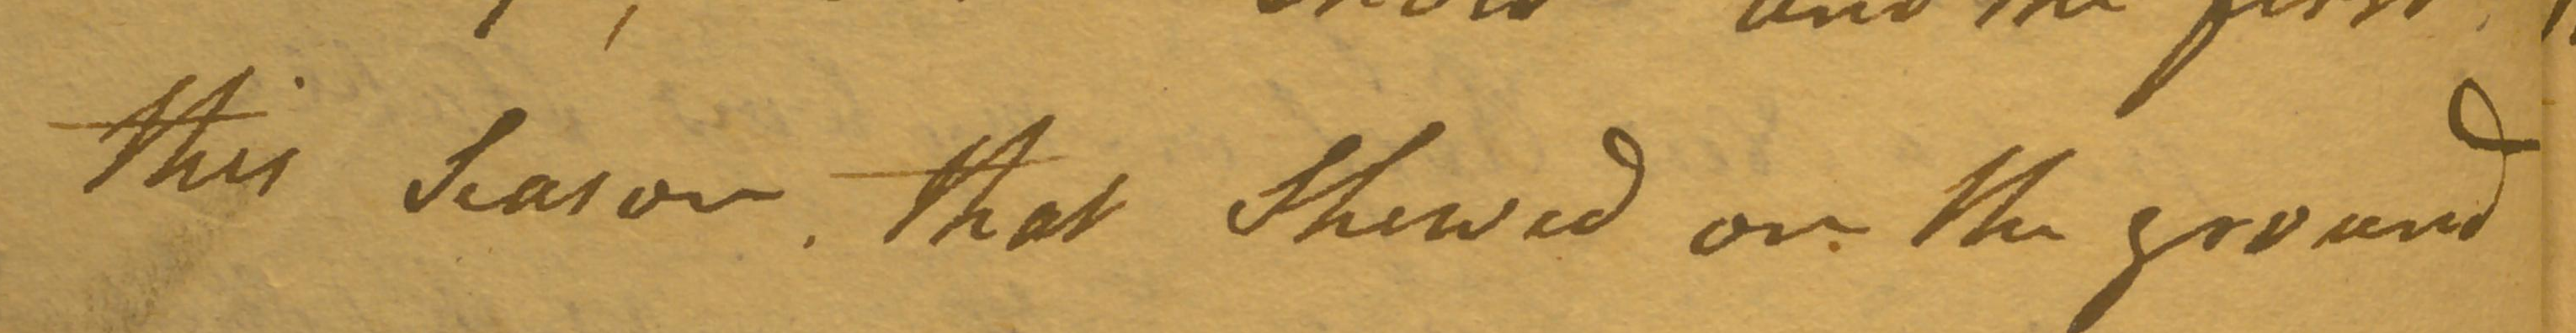this season that Shewed on the ground
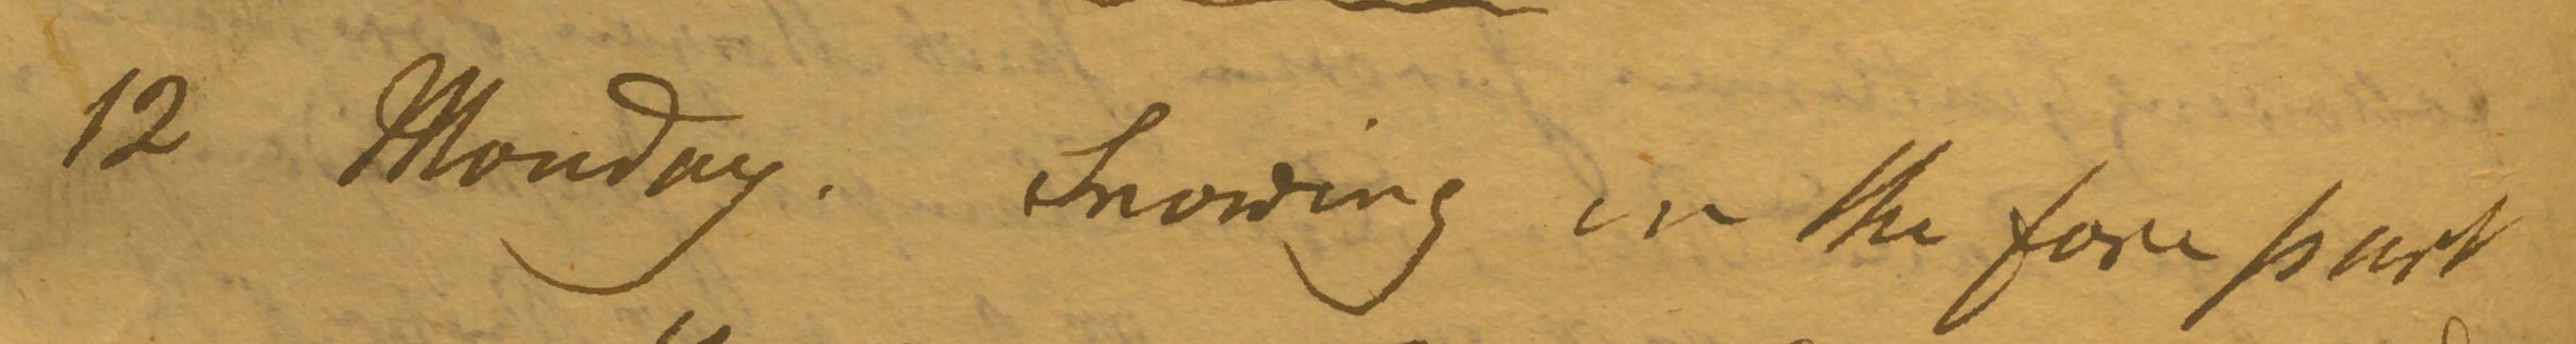12 Monday. snowing in the fore part
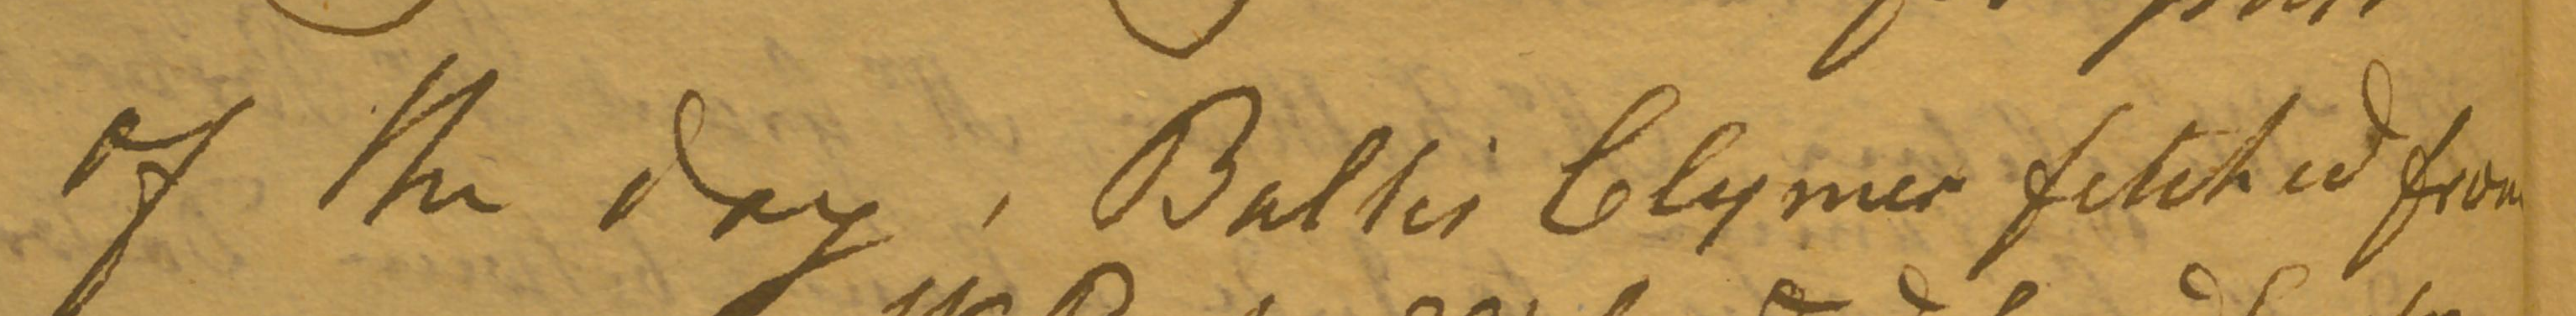of the day. Baltes Clymer fetched from
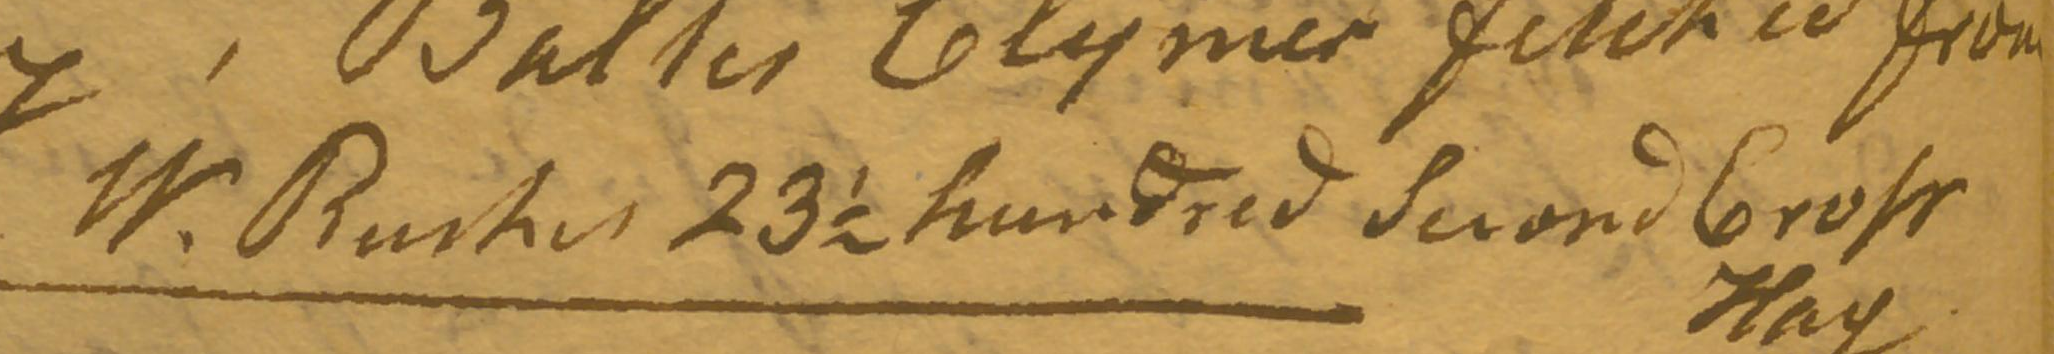W^r. Rushes 23 1/2 hundred Second Crop
